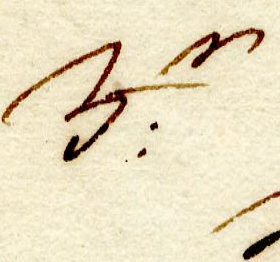y^r:
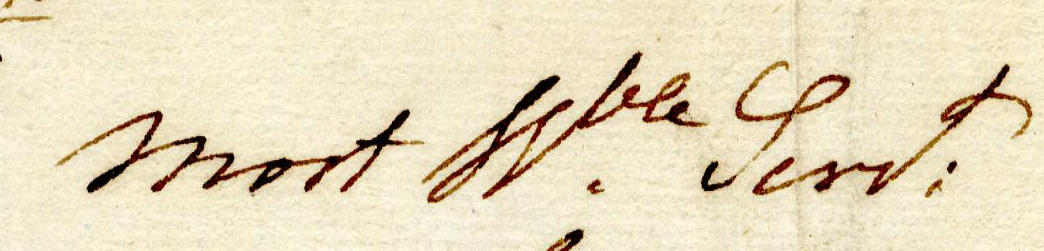most h^ble Serv^t:
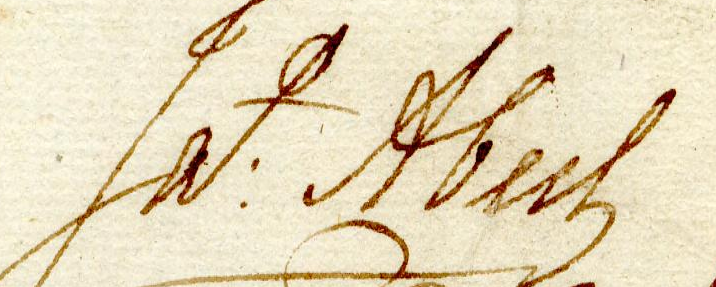Ja^s: Abeel
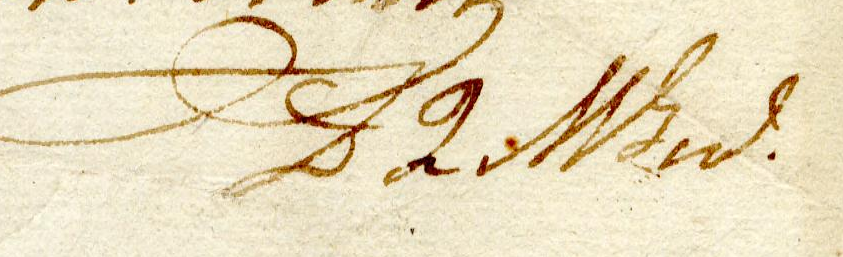D Q M Gen^l.
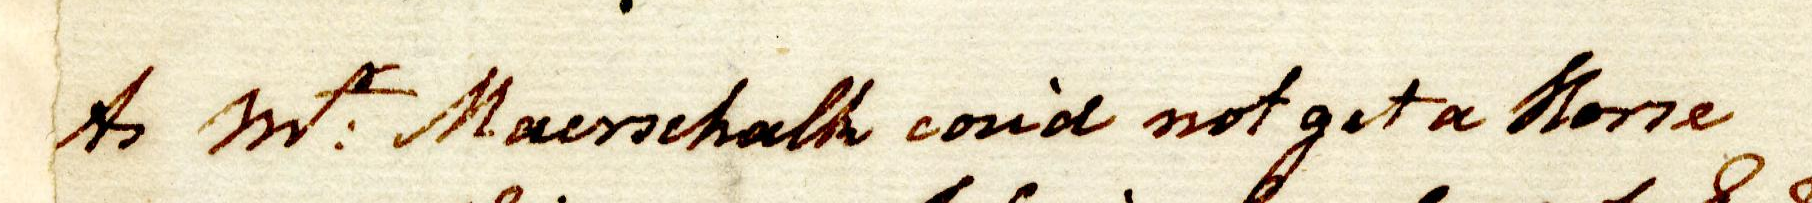As M^r: Marschalk cou'd not get a Horse
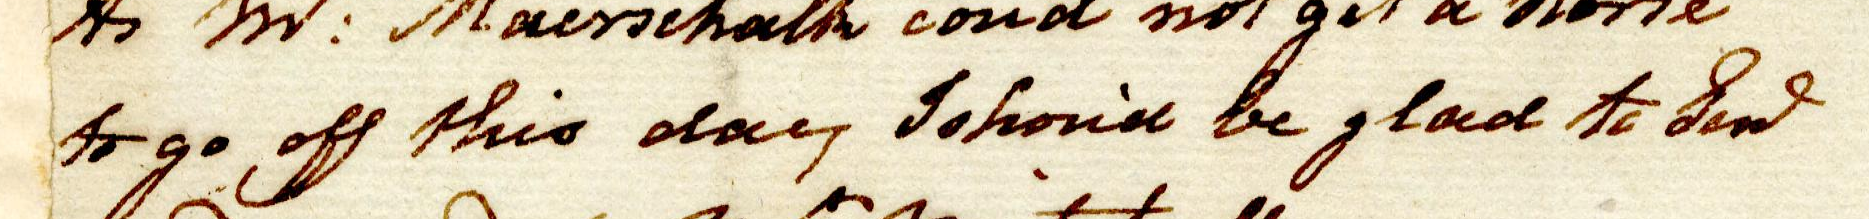to go off this day I shou'd be glad to Gen^l
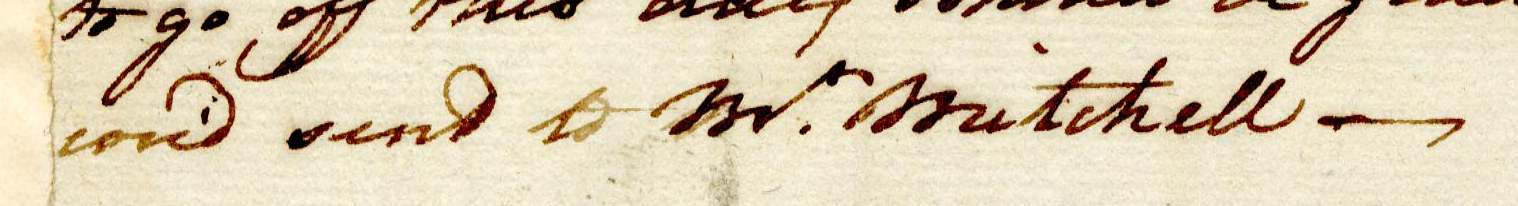cou'd send to M^r. Mitchell-
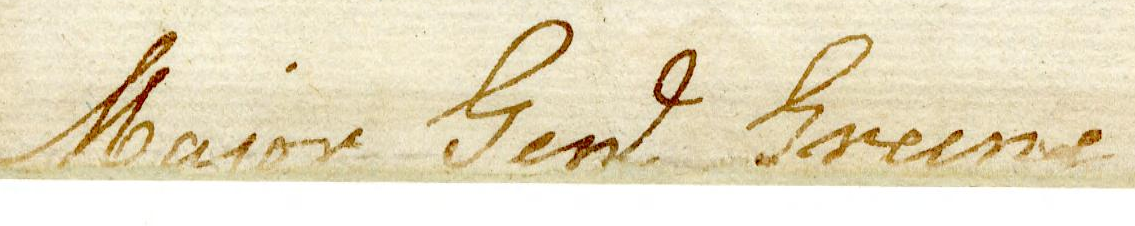Major Gen^l Greene
